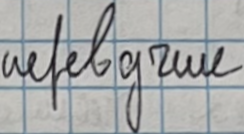перевозчик
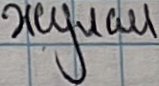жулан
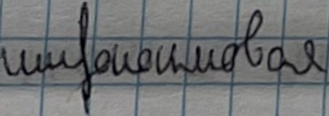ширококлювая
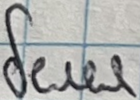белая
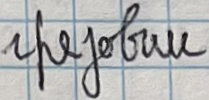грязовик
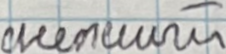снежный
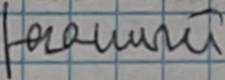рогатый
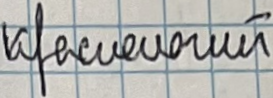красноногий
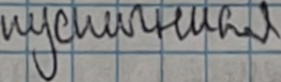пустынная
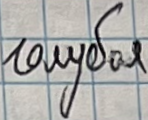голубая
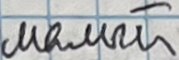малый
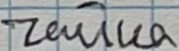чайка
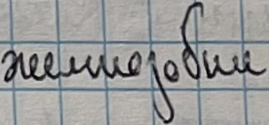желтозобик
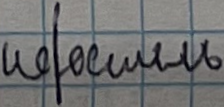коростель
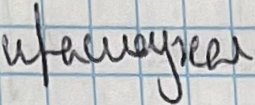красноухая
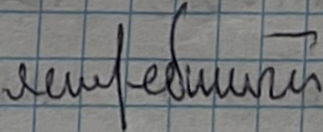ястребиный
